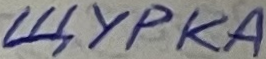щурка
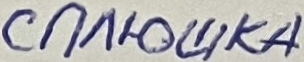сплюшка
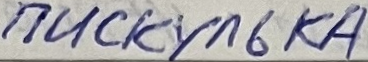пискулька
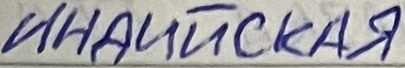индийская
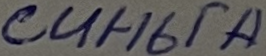синьга
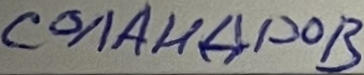соландров
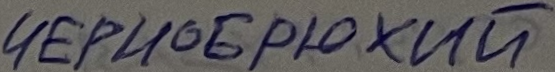чернобрюхий
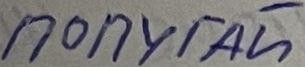попугай
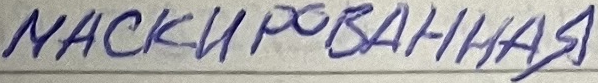маскированная
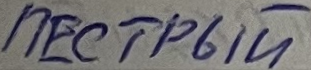пестрый
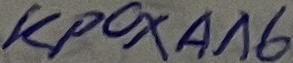крохаль
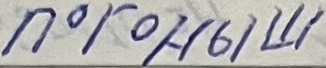погоныш
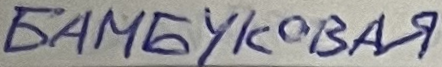бамбуковая
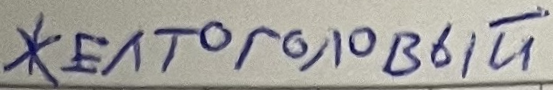желтоголовый
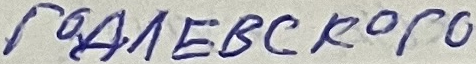годлевского
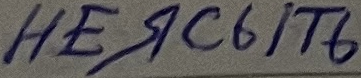неясыть
